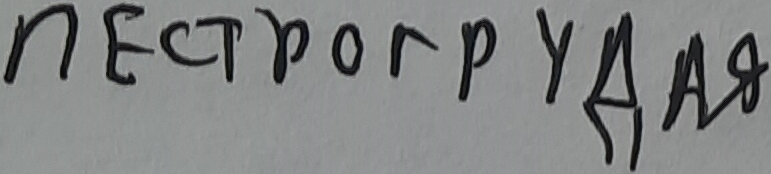пестрогрудая
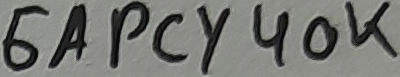барсучок
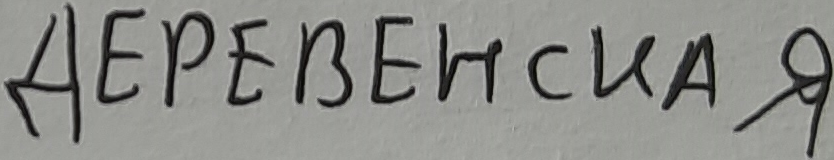деревенская
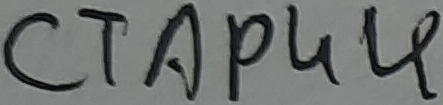старик
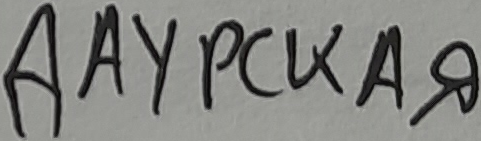даурская
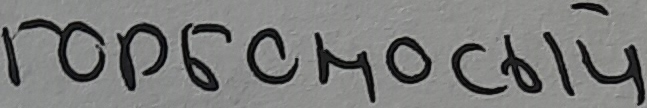горбоносый
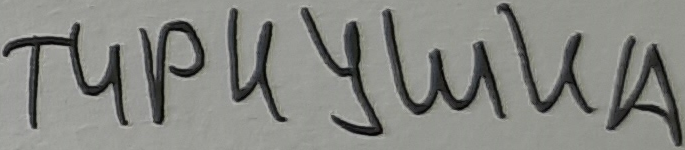тиркушка
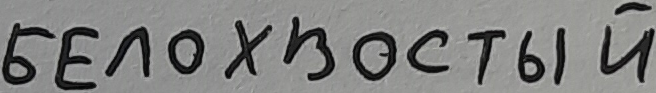белохвостый
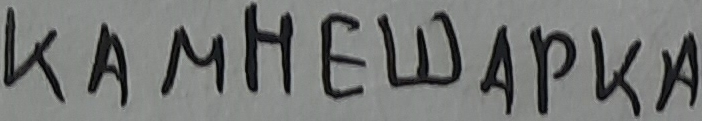камнешарка
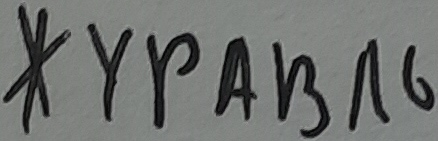журавль
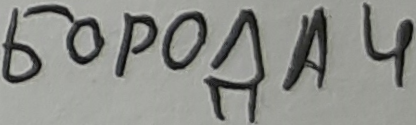бородач
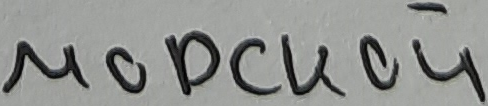морской
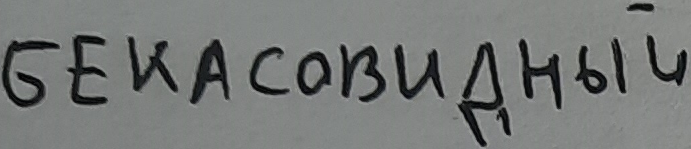бекасовидный
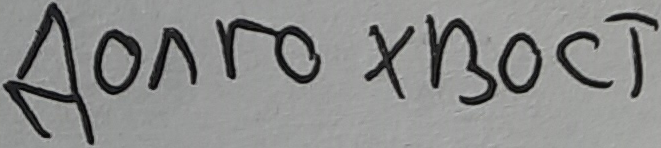долго хвост
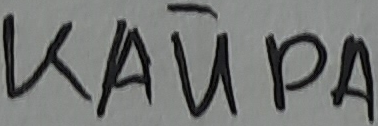кайра
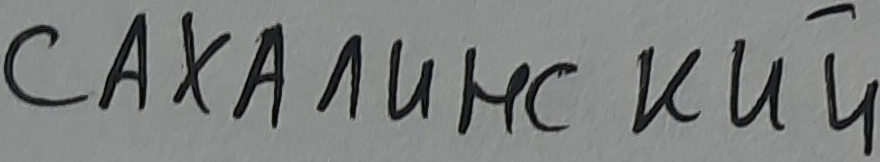сахалинс кий
